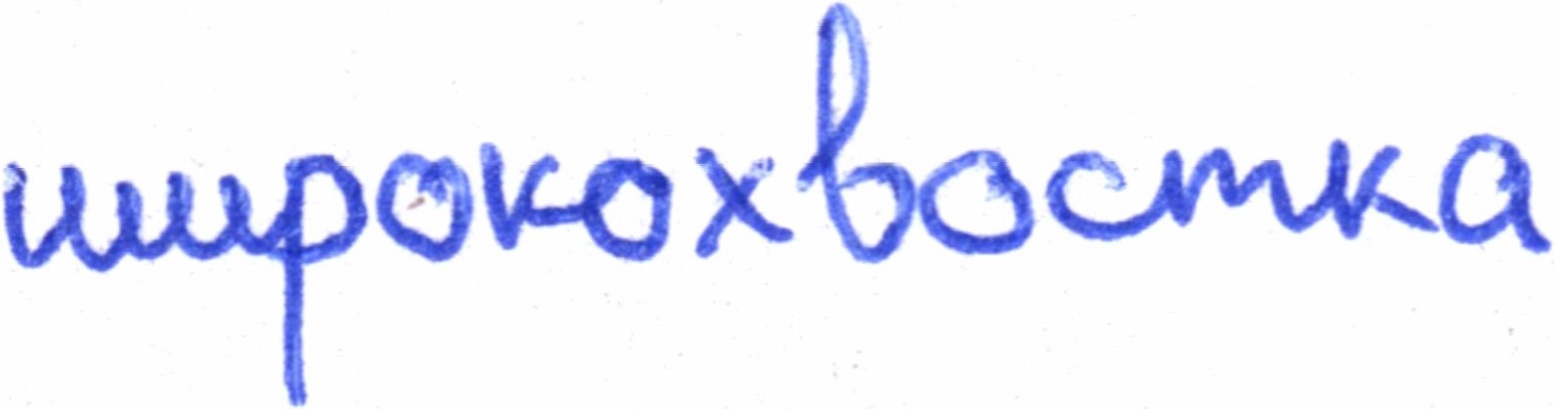широкохвостка
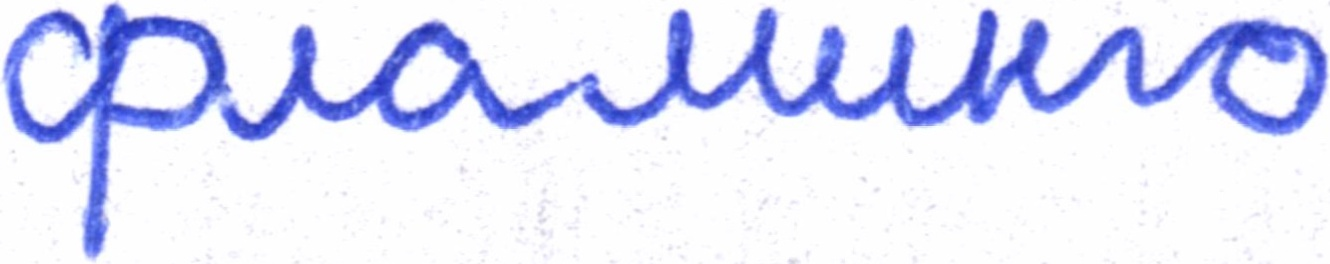фламинго
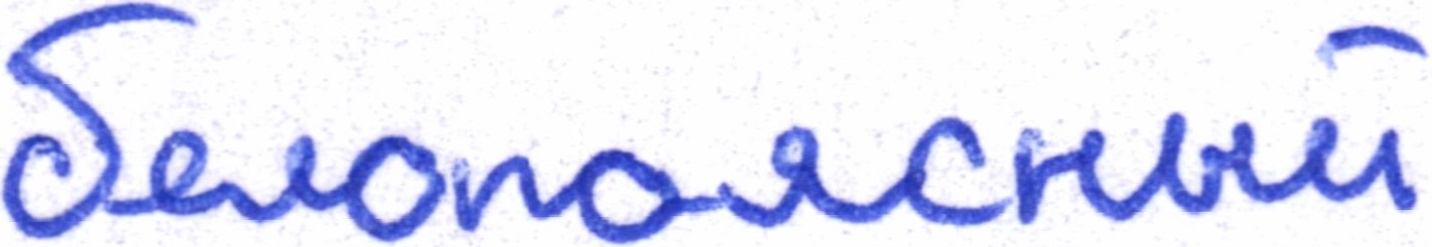белопоясный
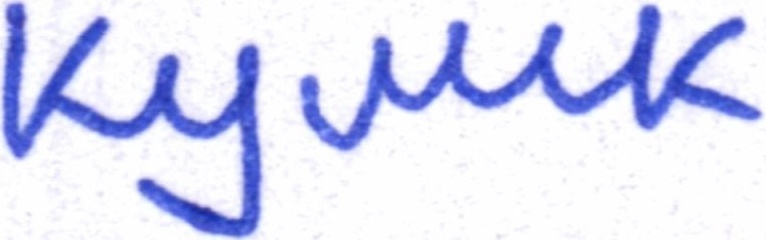кулик
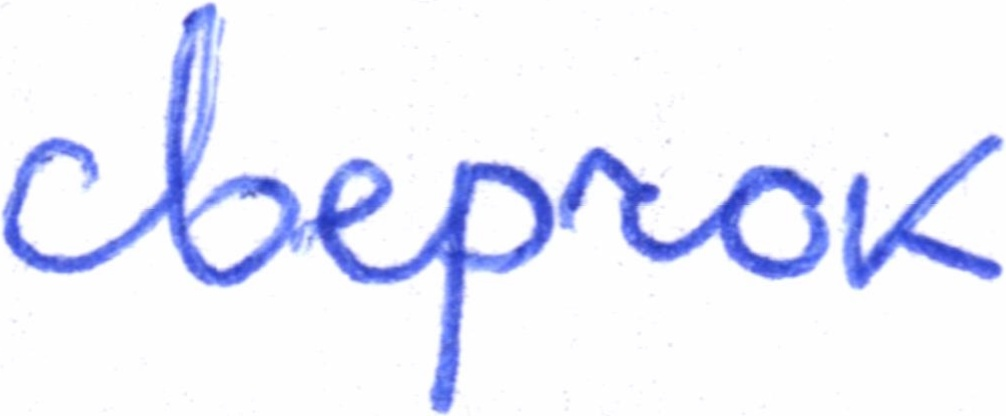сверчок
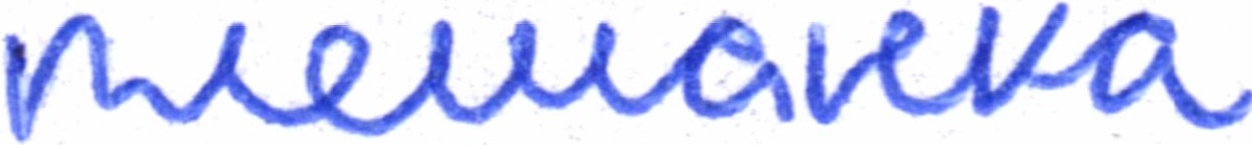плешанка
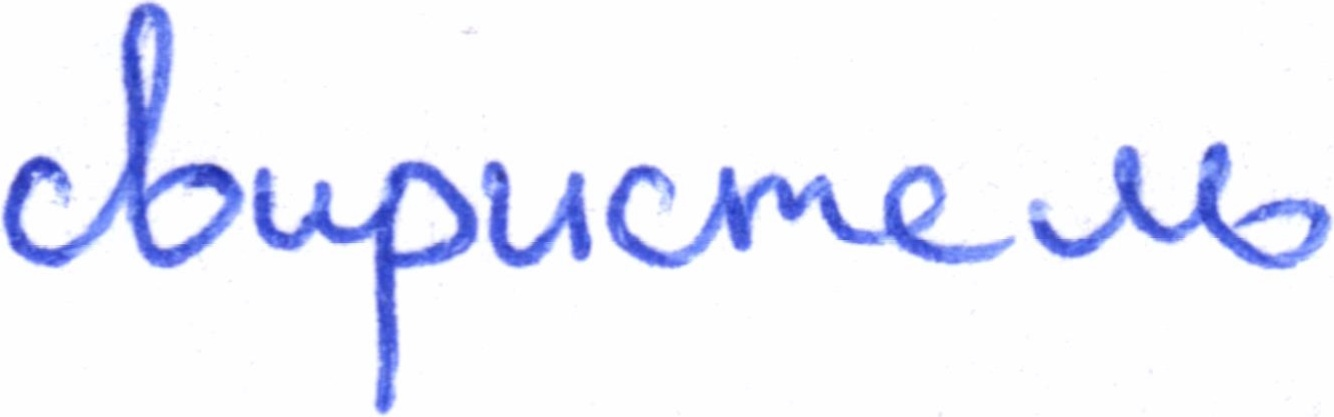свиристель
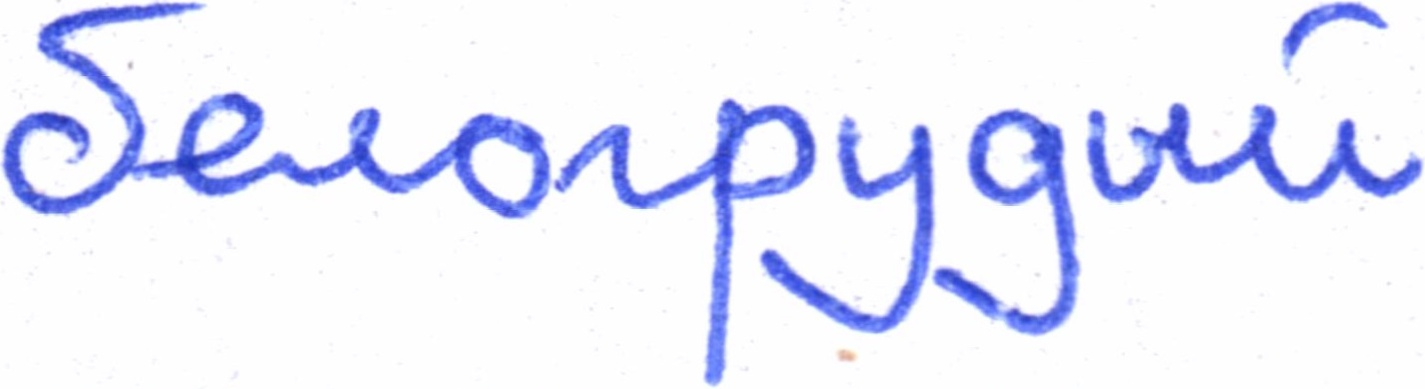белогрудый
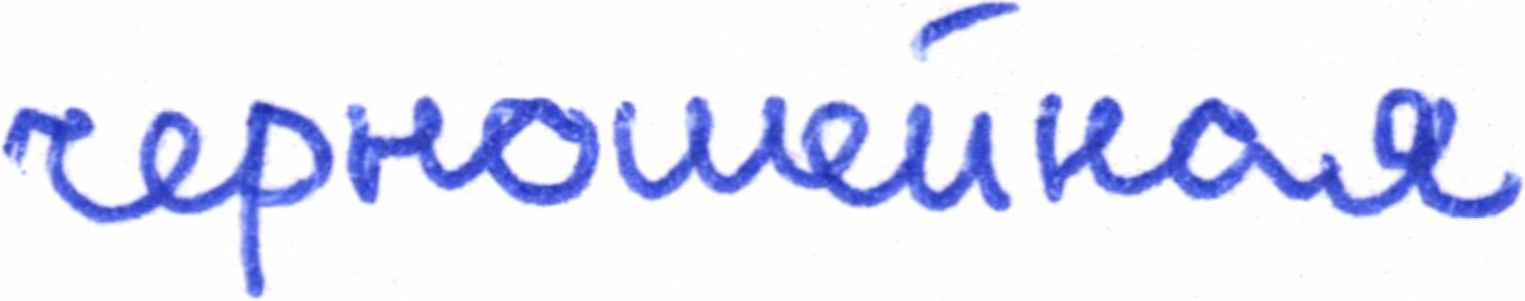черношейная
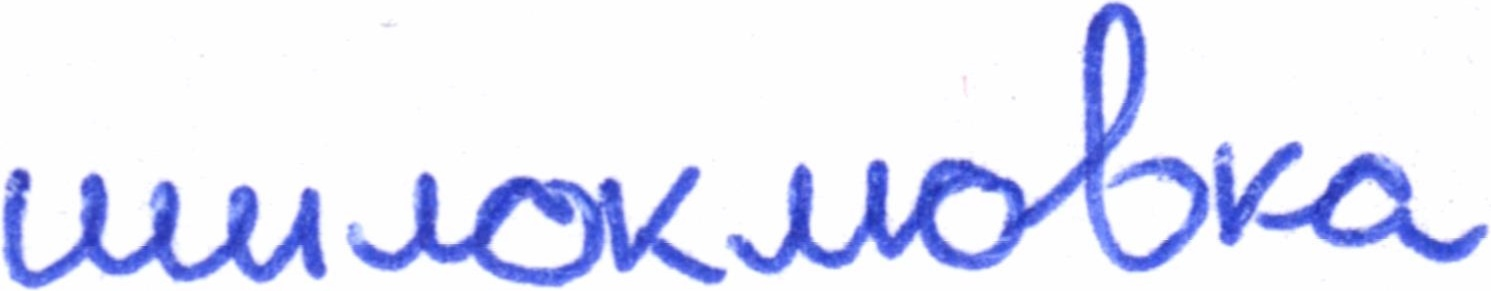шилоклювка
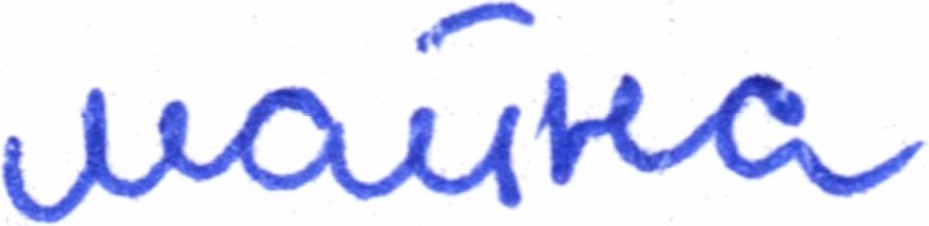майна
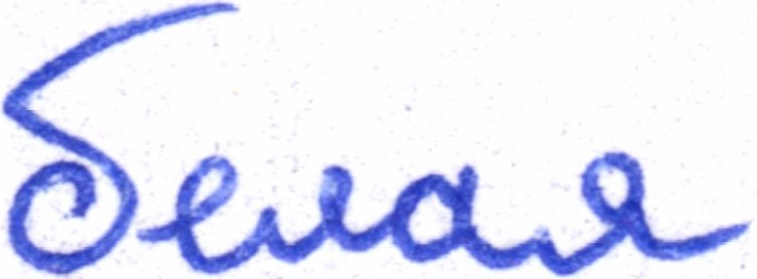белая
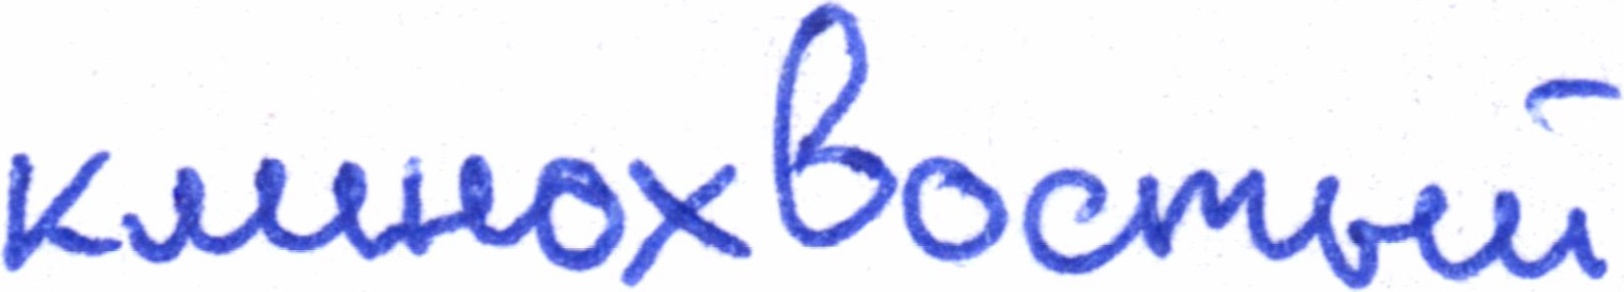клинохвостый
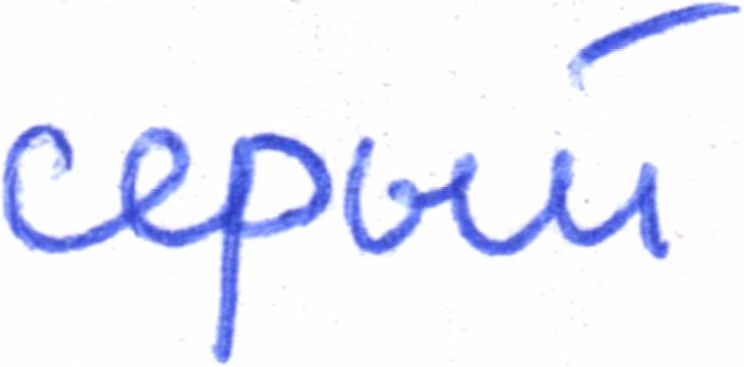серый
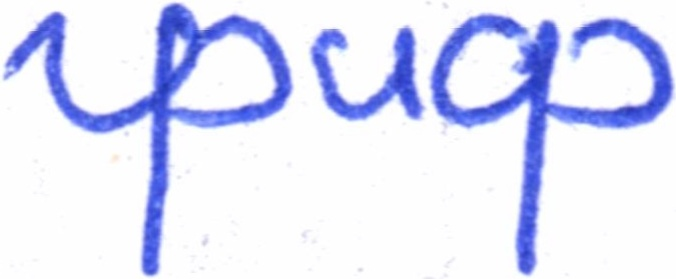гриф
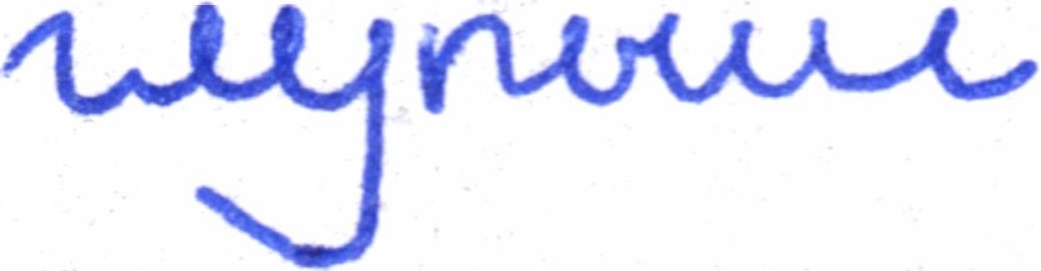глупыш
